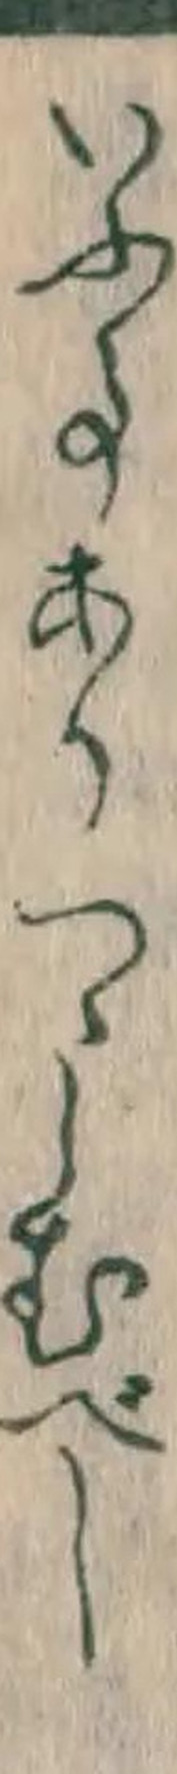いふ事ありつゝしむべし
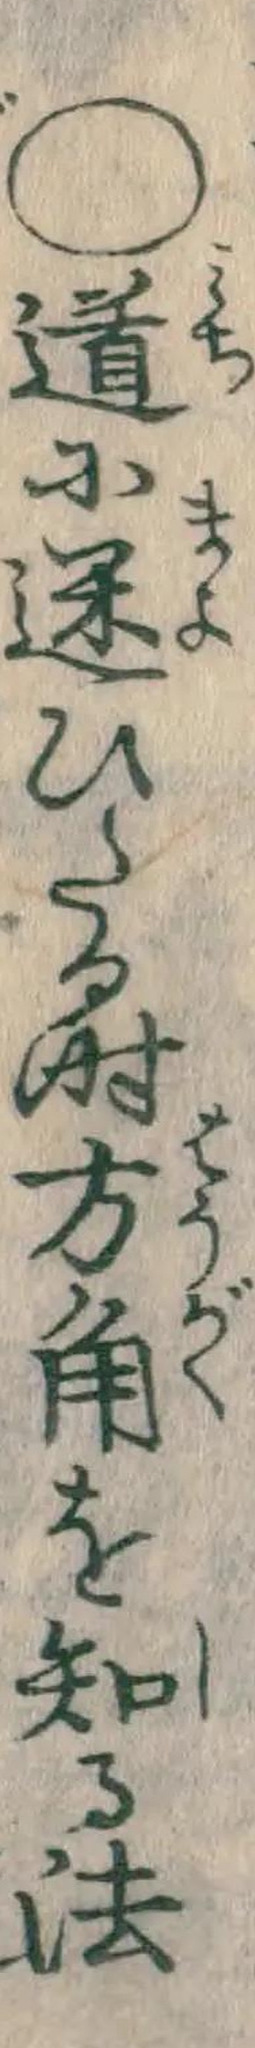○道に迷ひたる時方角を知る法
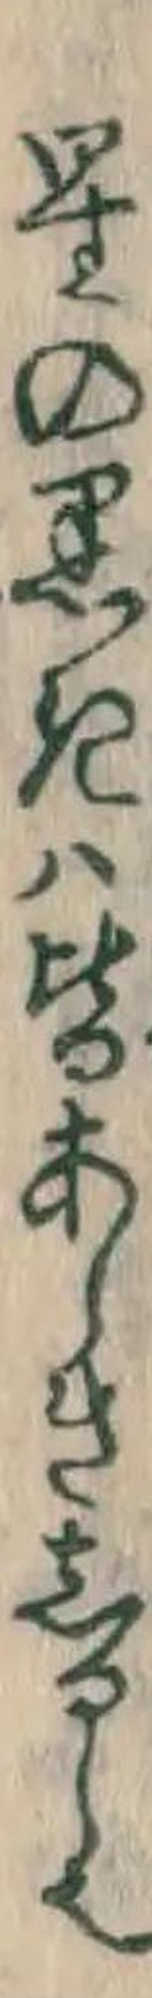星の黒きは皆あしきしるし也
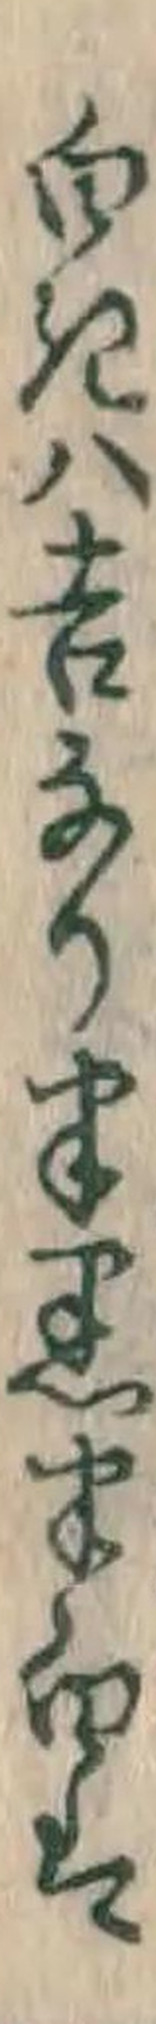白きは吉なり半黒半白は
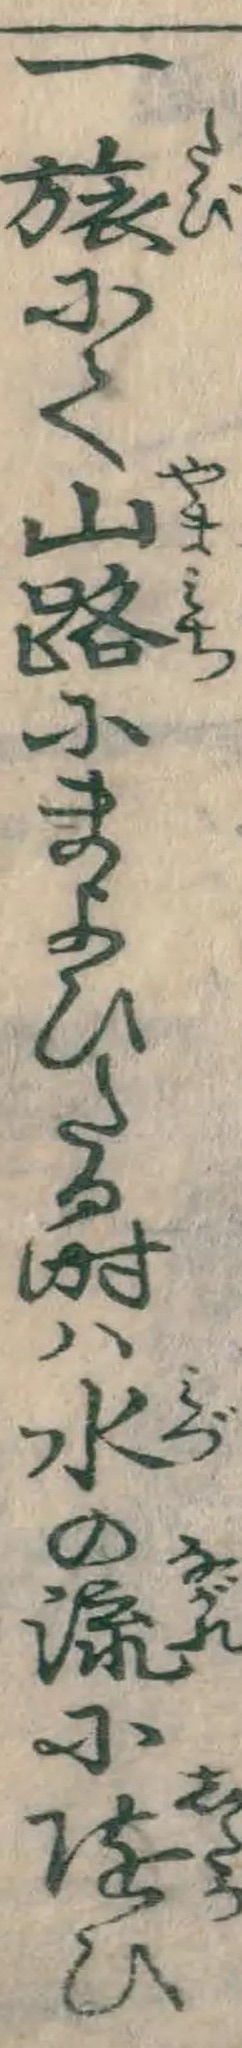一旅にて山路にまよひたる時は水の流に随ひ
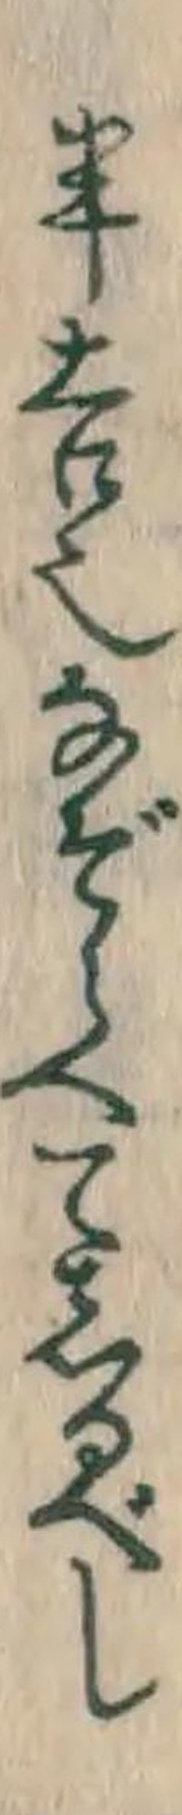半吉也なぞらへてしるべし
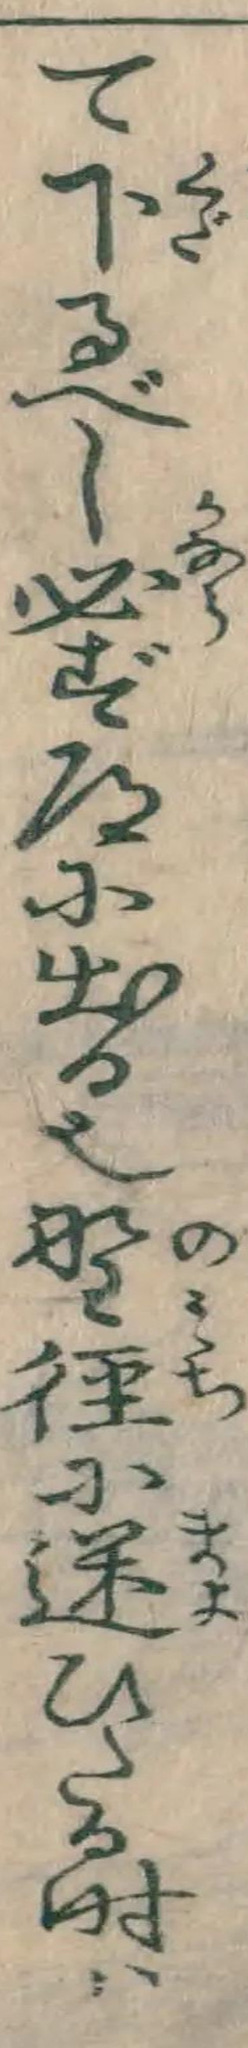て下るべし必ず道に出る也野径に迷ひたる時は

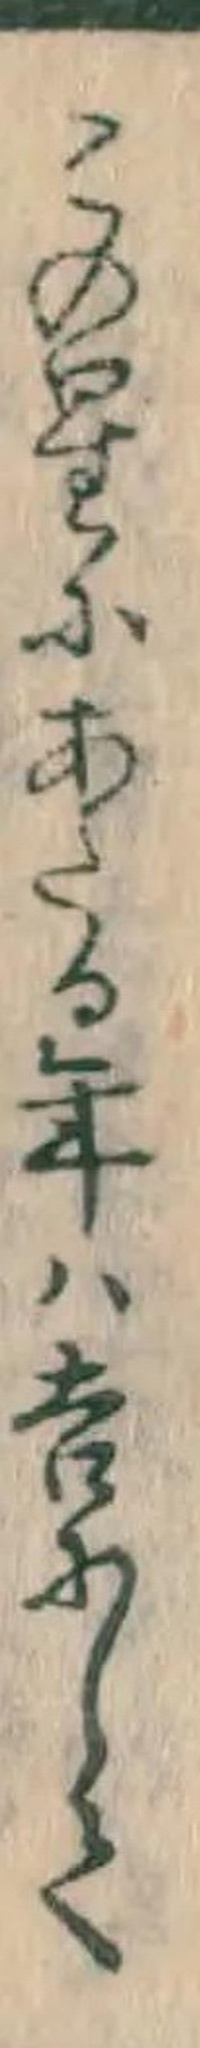この星にあたる年は吉にして
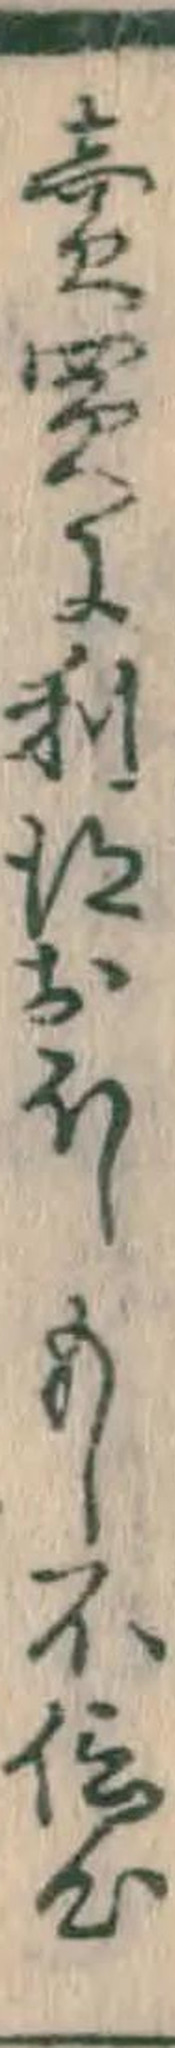売買に利得おほしもし不信心
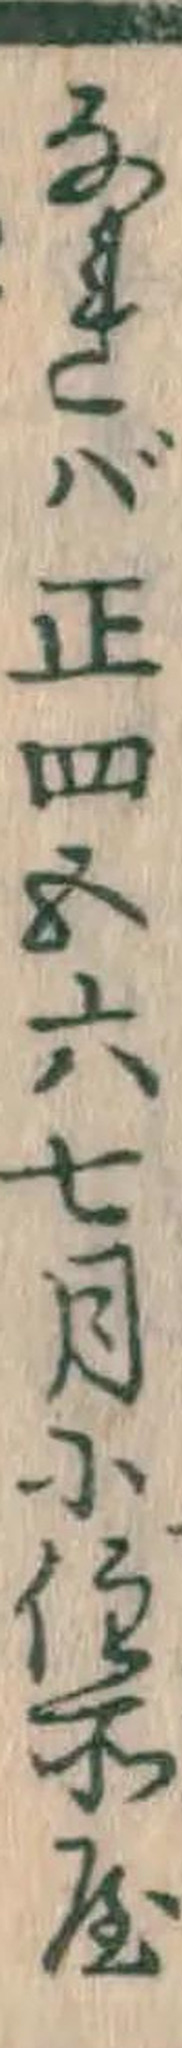なれば正四五六七月に住所屋
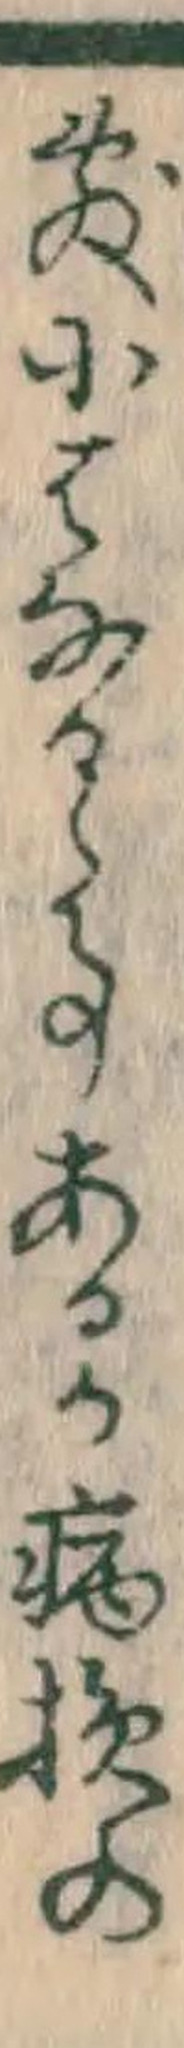敷にはなるゝ事あるか病損の
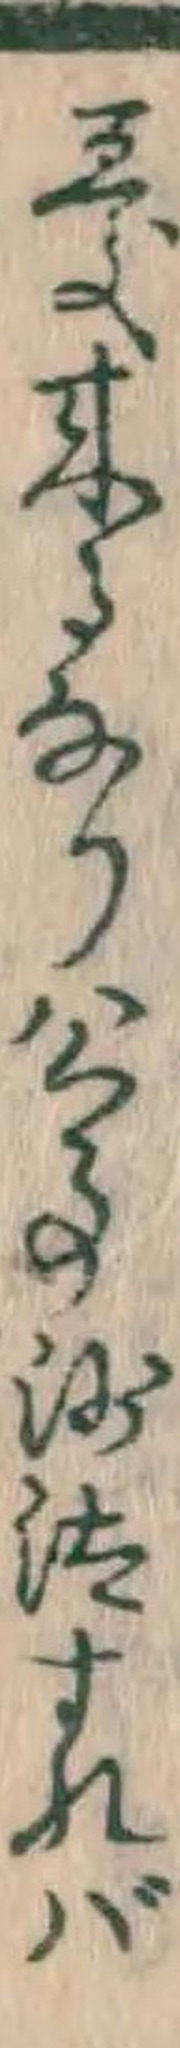憂来るなり公事沙汰すれば
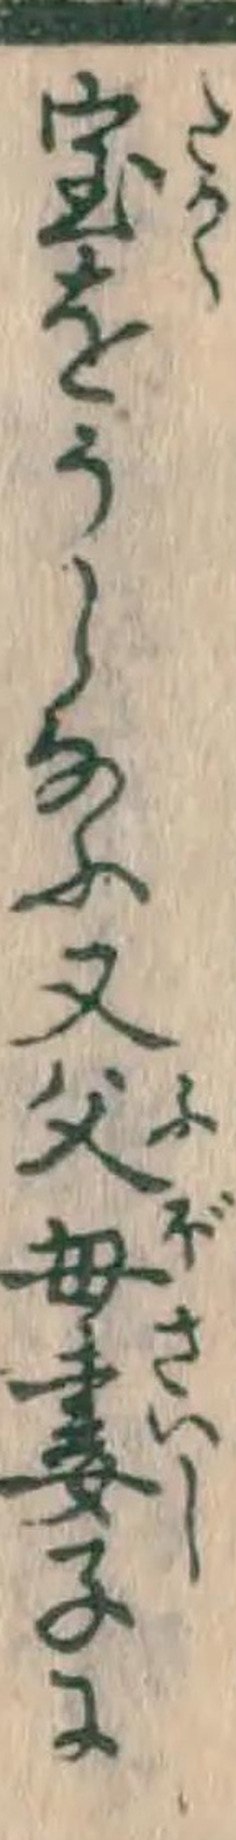宝をうしなふ又父母妻子に
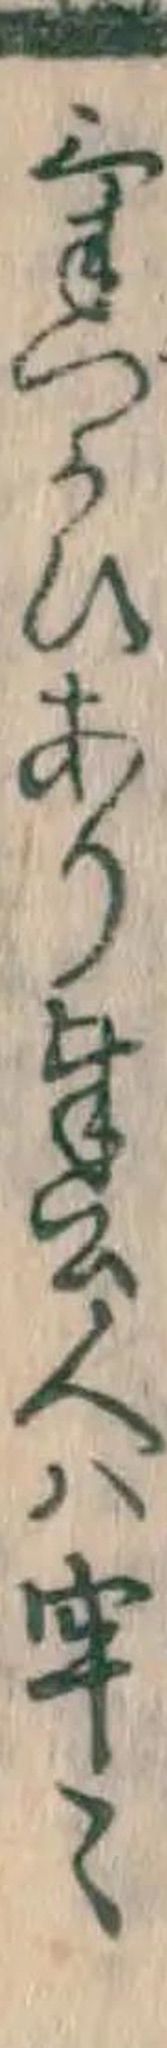気づかひあり奉公人は牢々
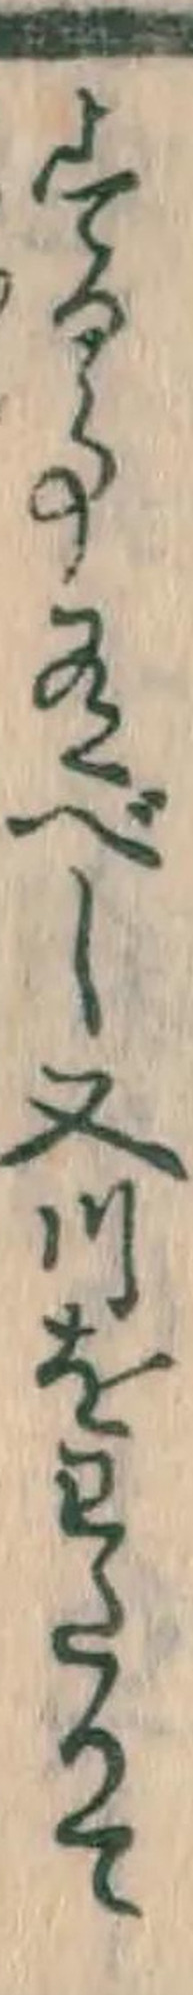する事有べし又川をわたりて
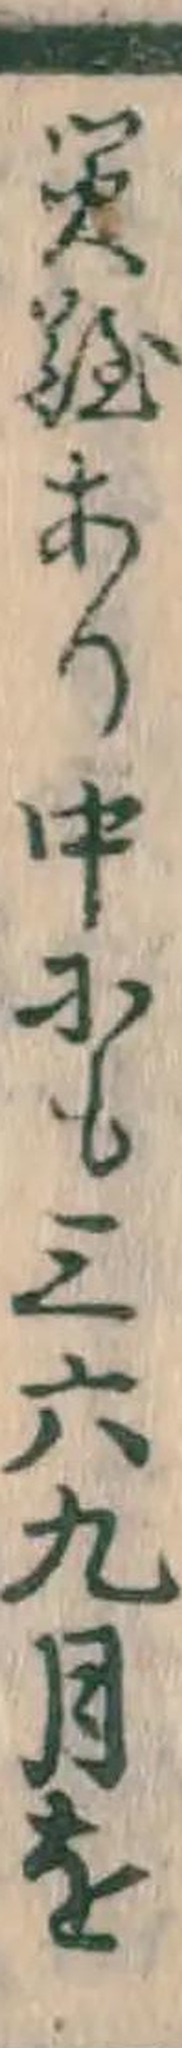災難あり中にも三六九月を
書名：広益秘事大全 3巻. [1]
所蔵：国立国会図書館 National Diet Library, JAPAN
